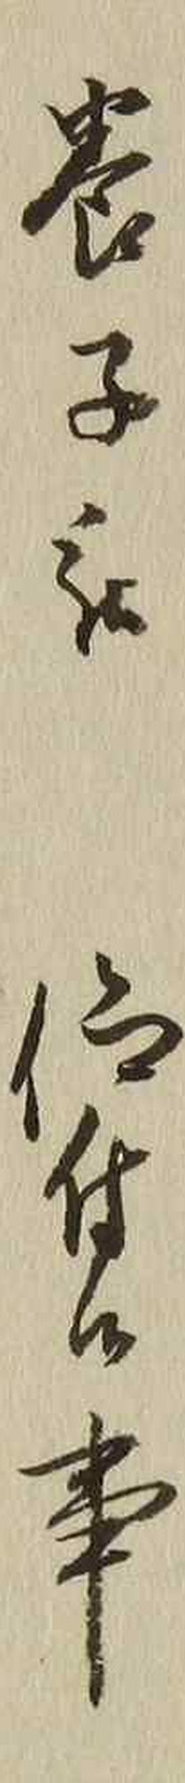養子被仰付候事
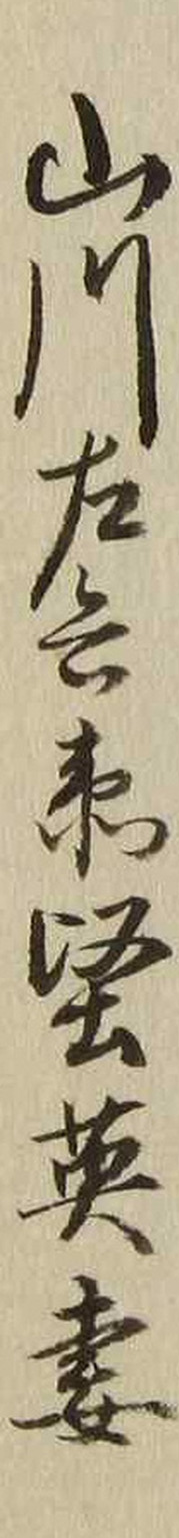女山川左兵衛堅英妻
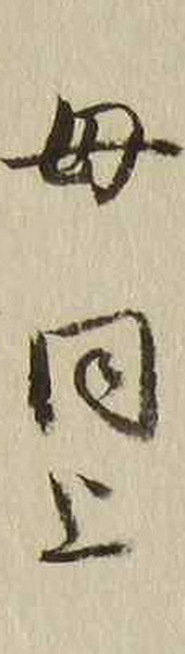母同上

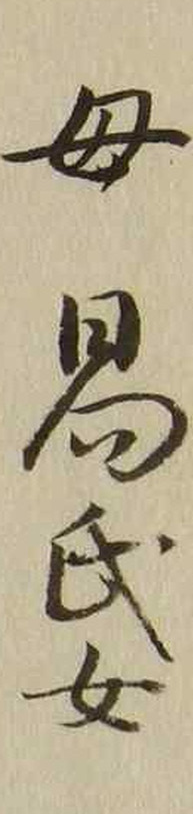母日向氏女
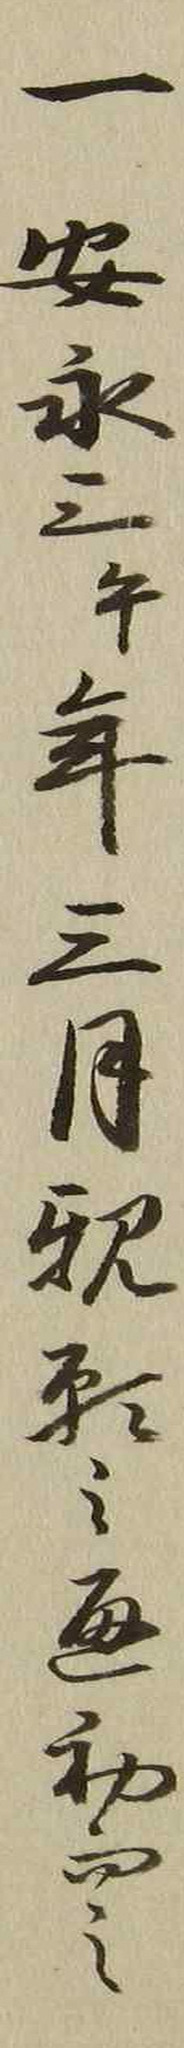一安永三午年三月親願之通初而之
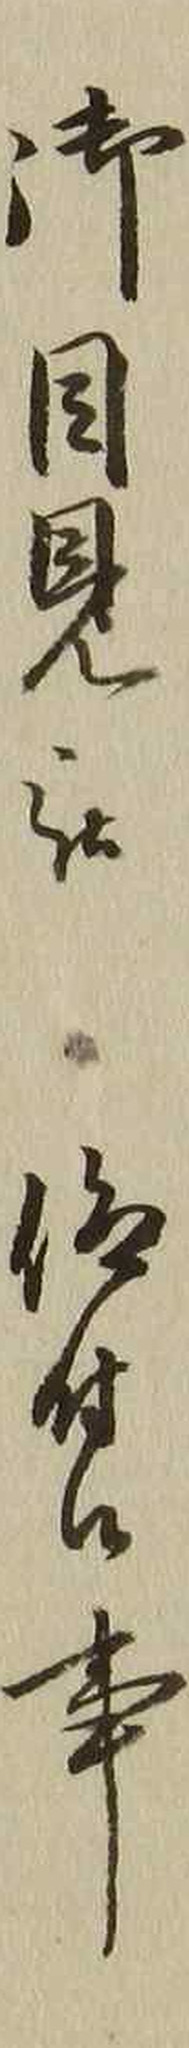御目見被仰付候事
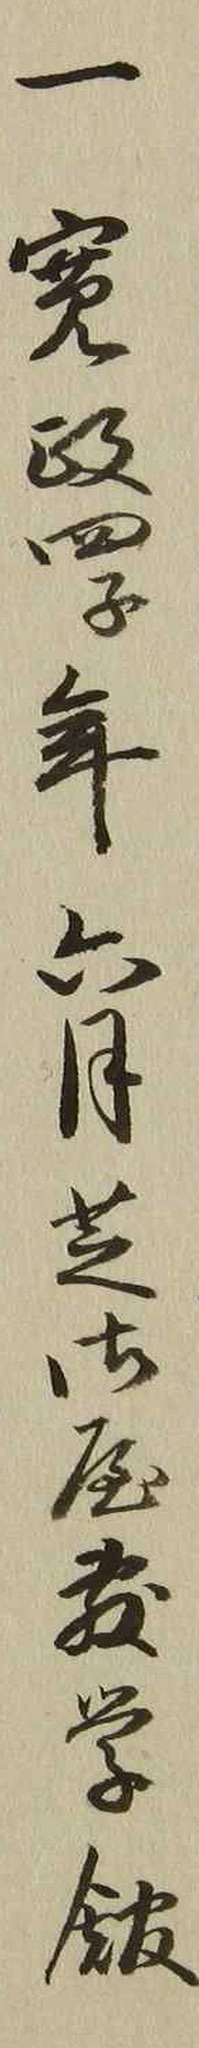一寛政四子年六月芝御屋敷学館
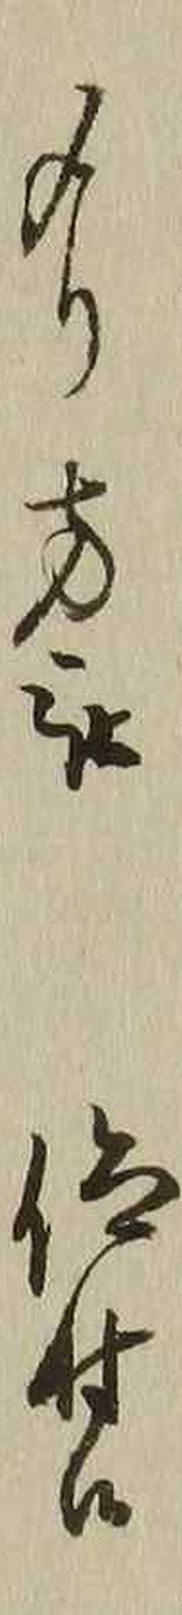〆り方被仰付候
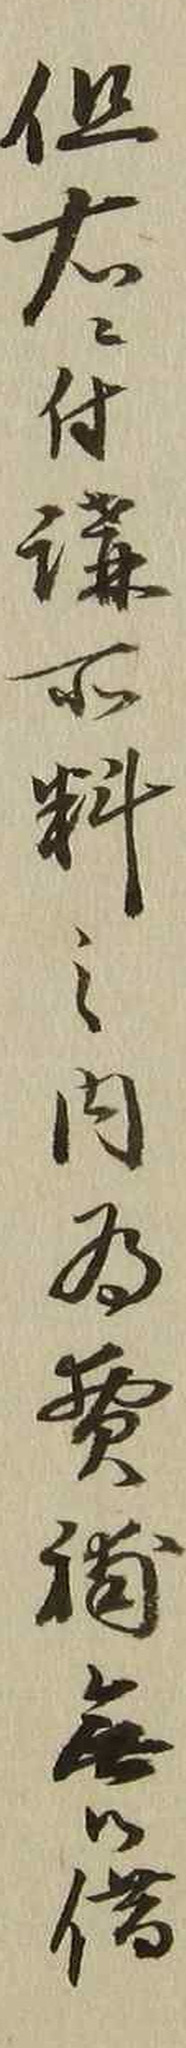但右ニ付講所料之内為費補無御借
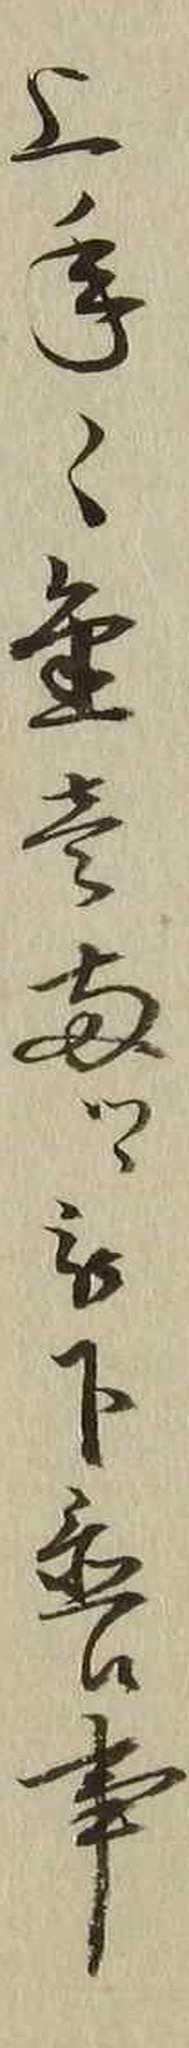上年々金壱両ツヽ被下置候事
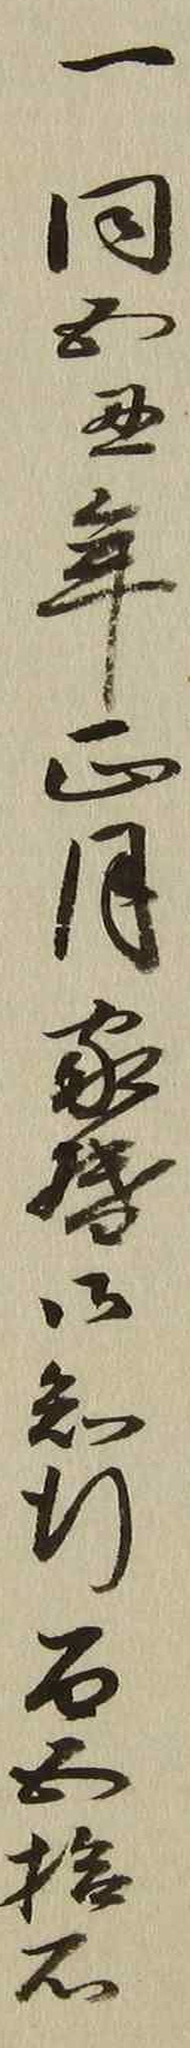一同五丑年正月家督御知行百五拾石
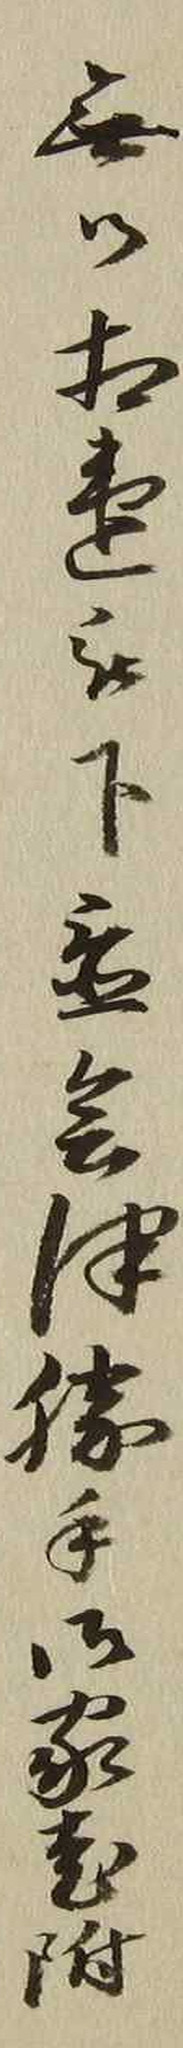無御相違被下置会津勝手御家老附
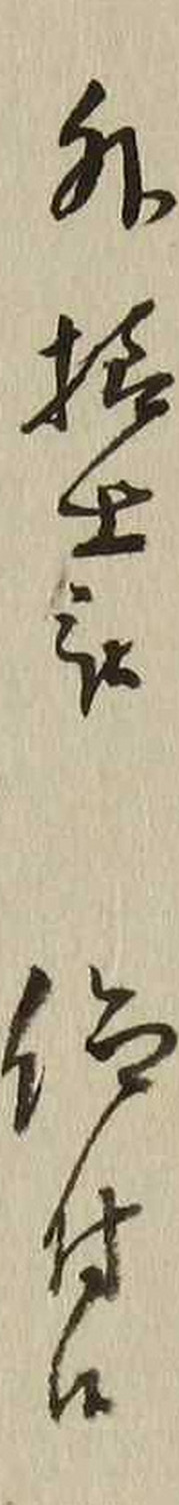外様士被仰付候
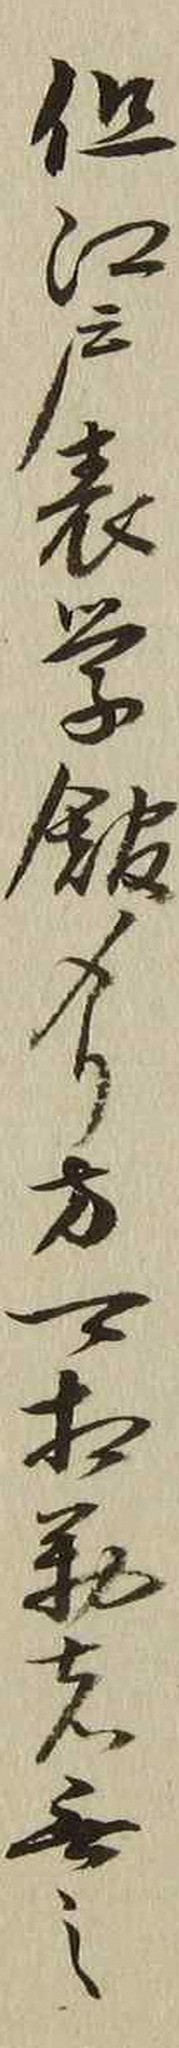但江戸表学館〆り方可相勤者無之
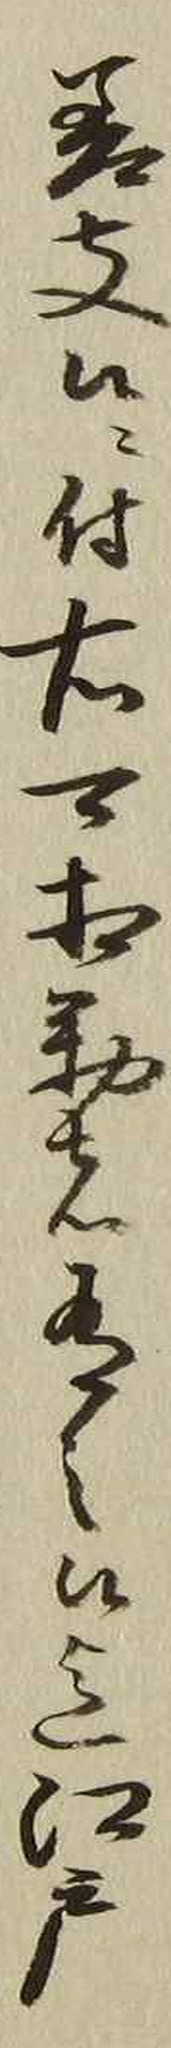差支候ニ付右可相勤者有之候迄江戸
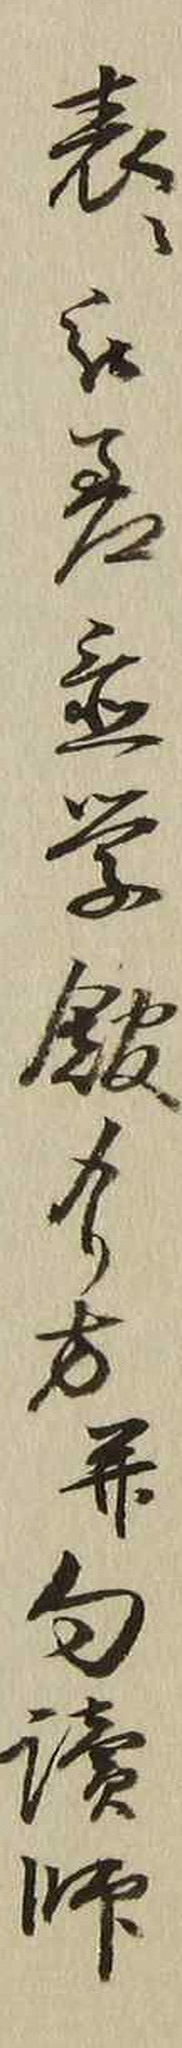表へ被差置学館〆り方幷句読師
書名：諸士系譜　巻之61　と之部4
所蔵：会津若松市立会津図書館
